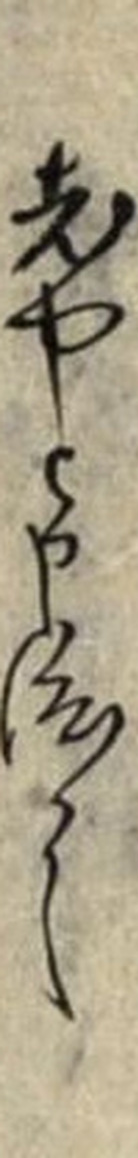老中被被申渡之
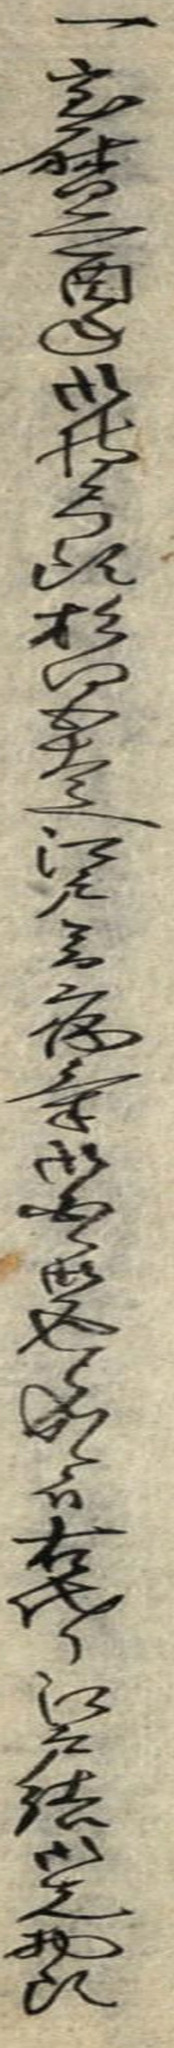一宝暦二酉年御持弓頭杉田五太夫江戸に而病気御国へ御返被成候に付右代り江戸詰御先物頭
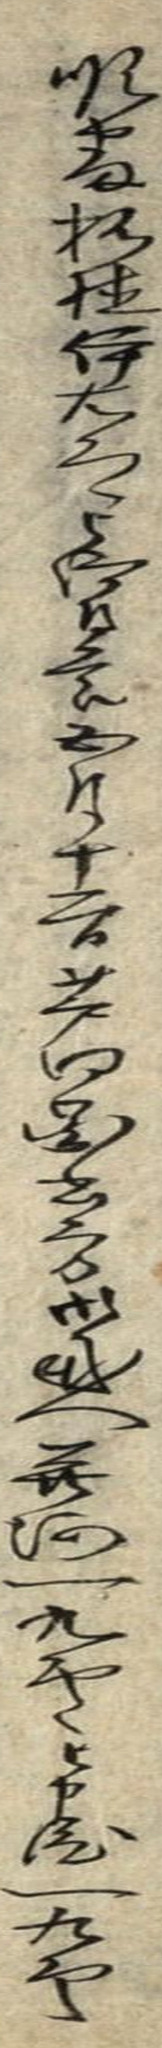順番柘植伊右衛門へ被仰付候節五月十二日芦田図書方御用人並河一九郎へ被申渡一九郎
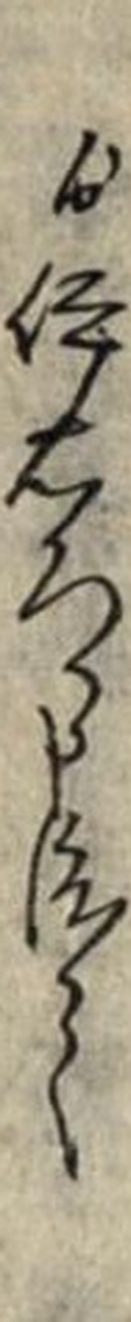ゟ伊右衛門へ申渡之
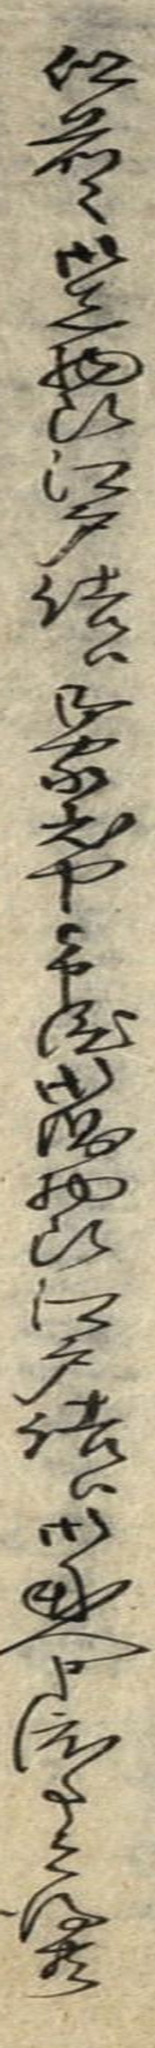但前々御先物頭江戸詰は御家老中被申渡御側物頭江戸詰は御用人申渡候事に候得共
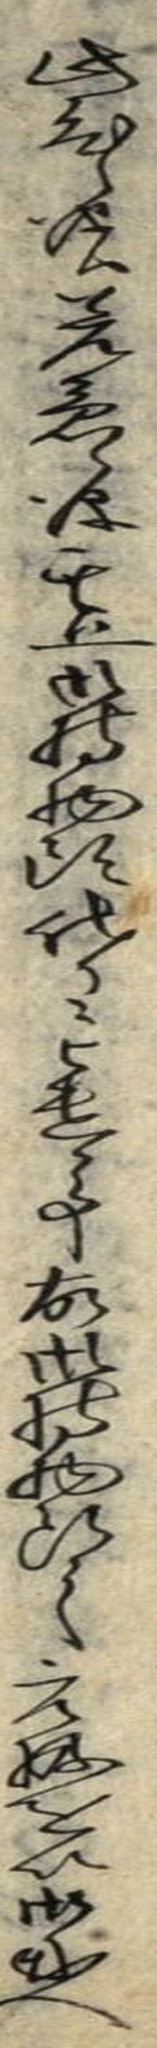此度之儀は差急之儀其上御持物頭代りに被遣候事故御持物頭之取扱を以御用人
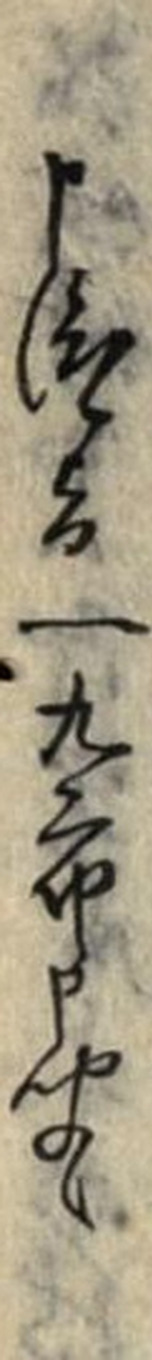申渡候旨一九郎申聞候

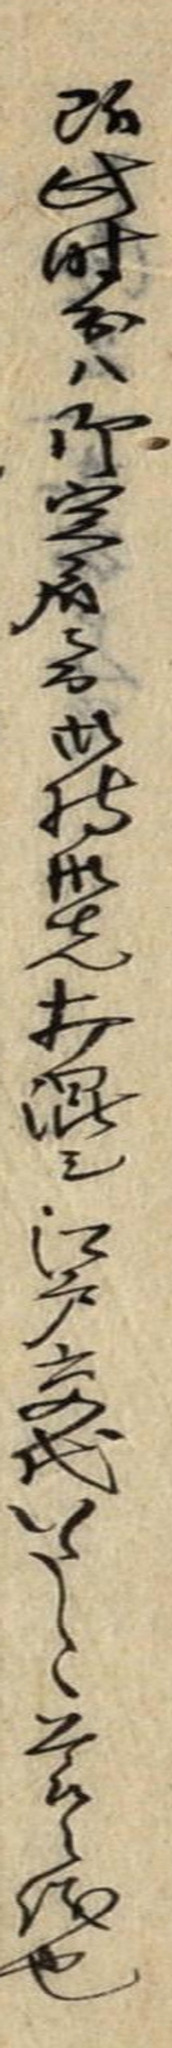附此時分は御定府に而御持御先打混し江戸交代いたし候節之儀也
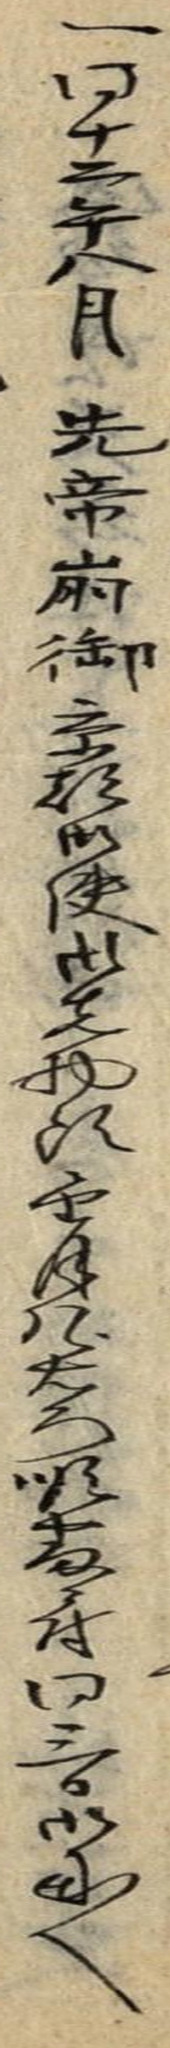一同十二午八月先帝崩御京都御使御先物頭望月八郎右衛門順番に付同三日御用人
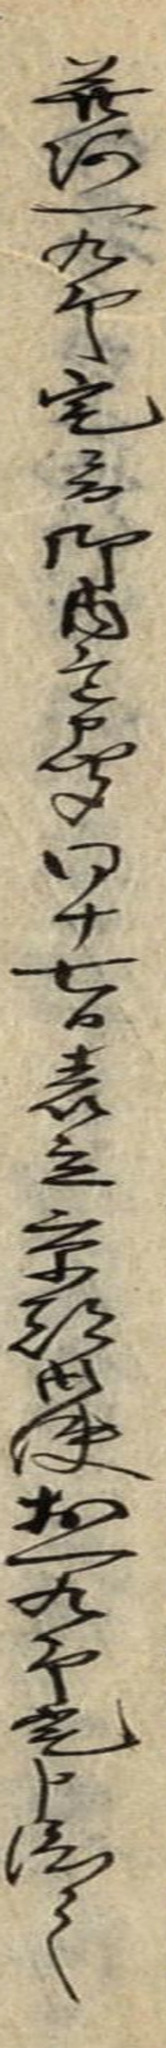並河一九郎宅に而御内意申聞同十七日表立京都御使於一九郎宅申渡之
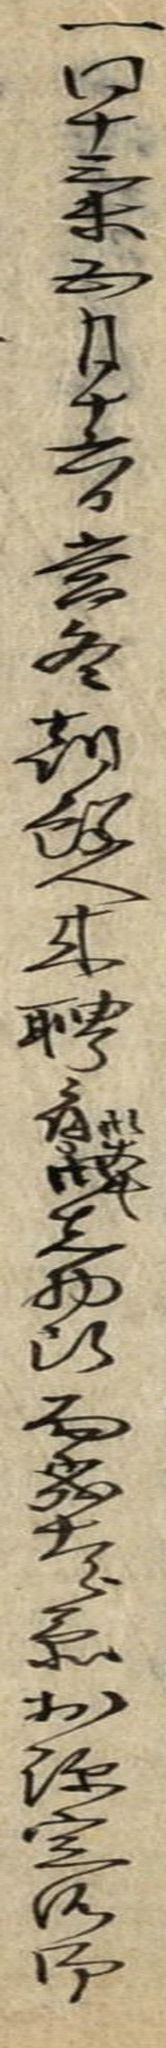一々十三未五月十六日当冬朝鮮人来聘候に付御使者御先物頭雨森太郎兵衛於評定所御
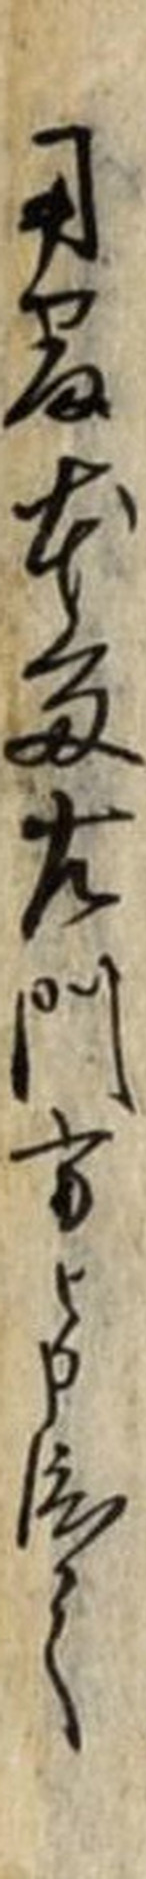用番本多左門方被申渡之
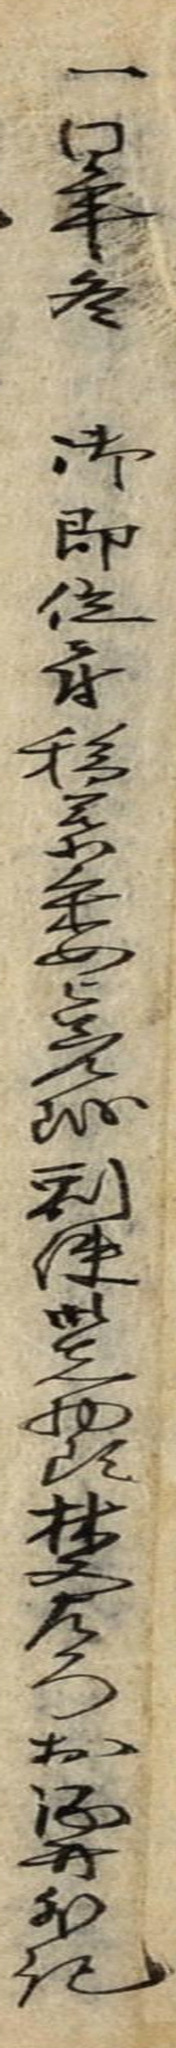一同年冬御即位に付稻葉采女被差越副使御先物頭林又左衛門於酒井外記
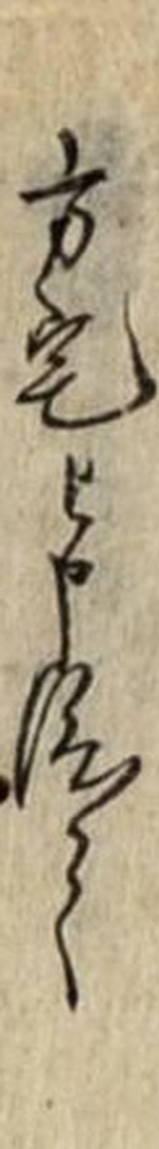方宅被申渡之
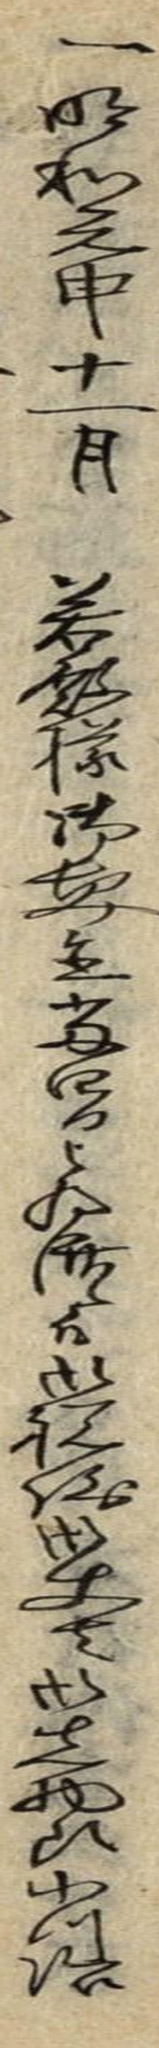一明和元申十一月若殿様御髪置当四日被為済候に付御祝儀御使者御先物頭小川治
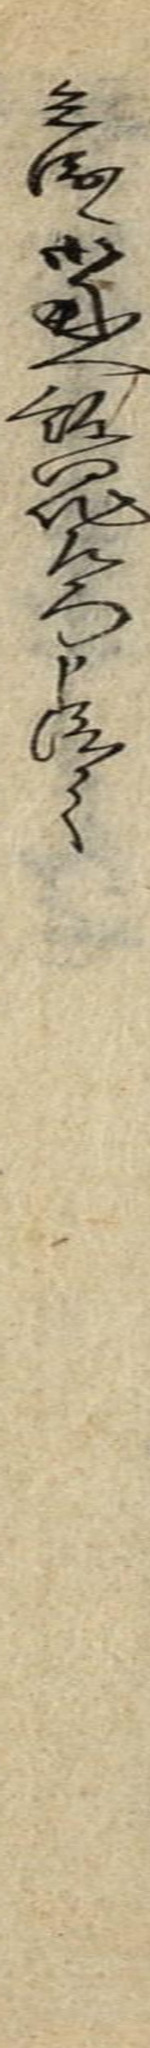兵衛へ御用人飯田作左衛門申渡之
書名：御用并被仰出之部
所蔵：福井県文書館 Fukui Prefectural Archives
